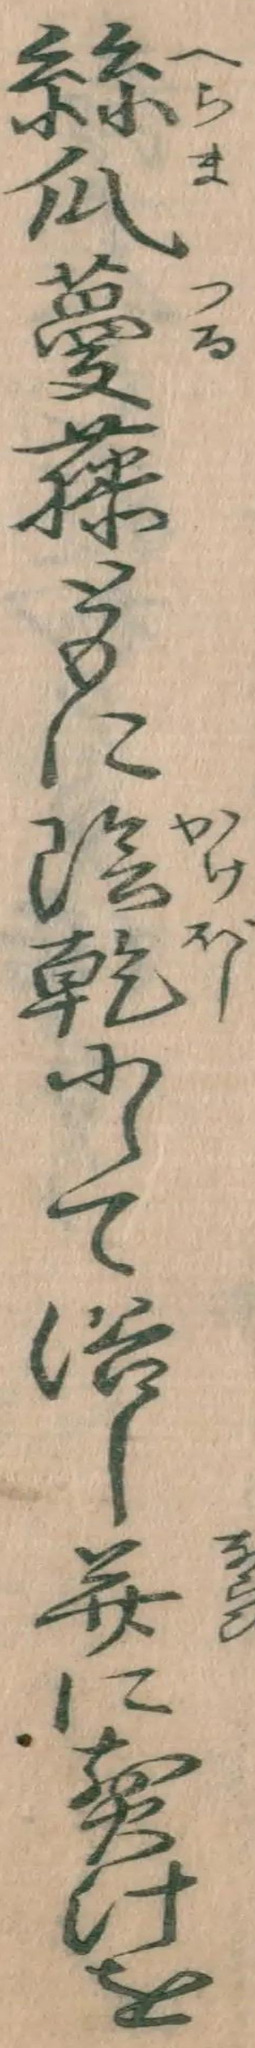糸瓜蔓藤ともに陰乾にして浴し并に煎汁を

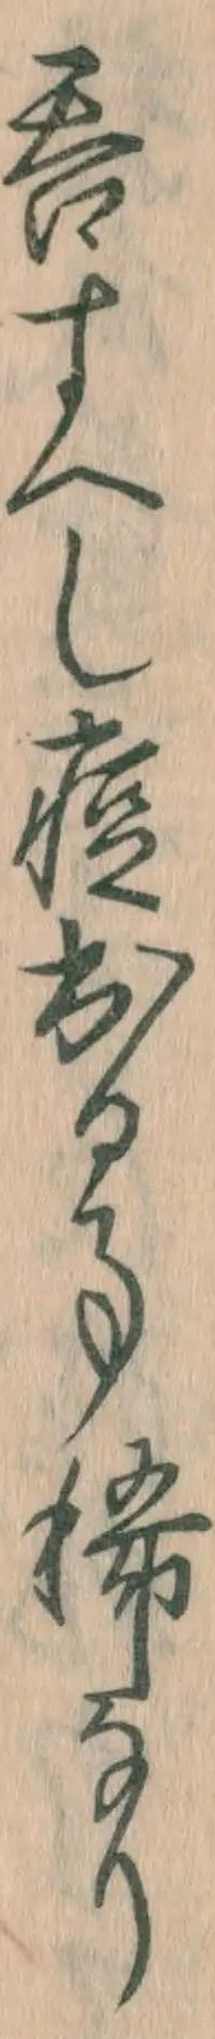呑すへし痘出る事稀なり
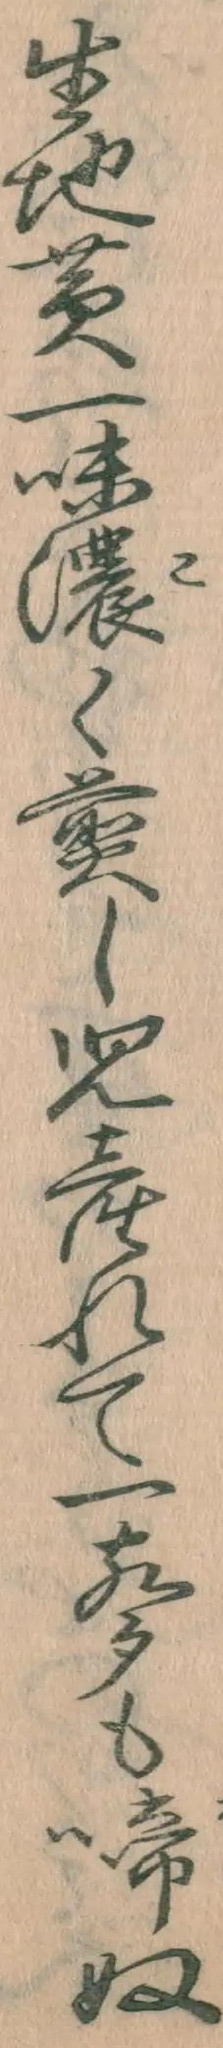生地黄一味濃く煎し児産れて一声も啼ぬ
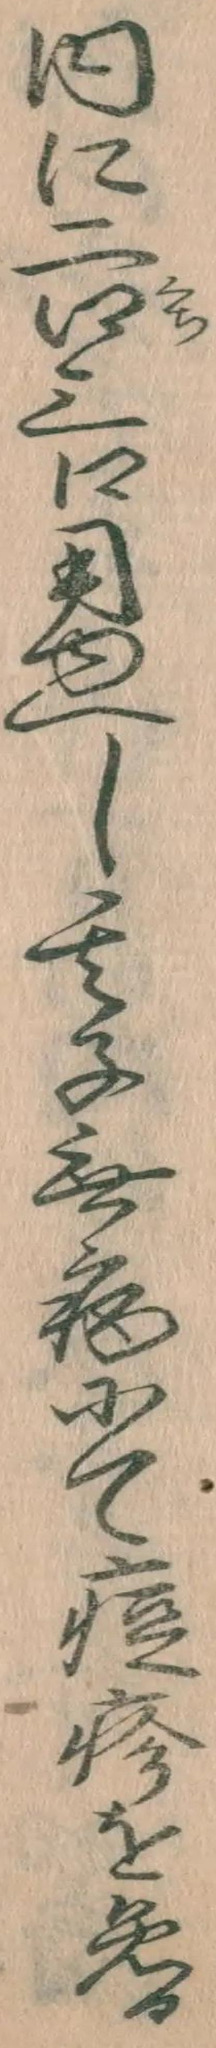内に二口三口用ゆへし其子無病にて痘疹を免る
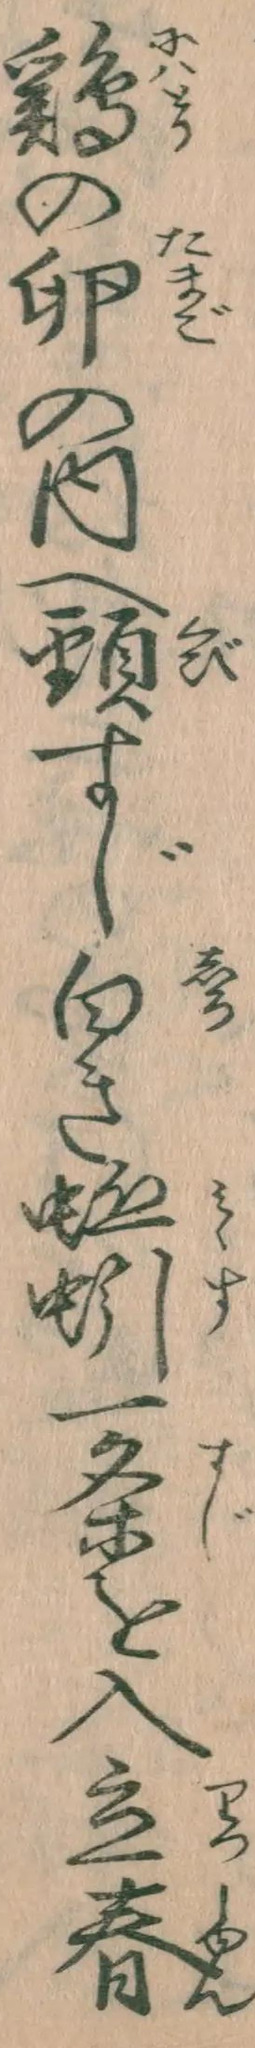鶏の卵の内へ頸すじ白き蚯蚓一条を入立春
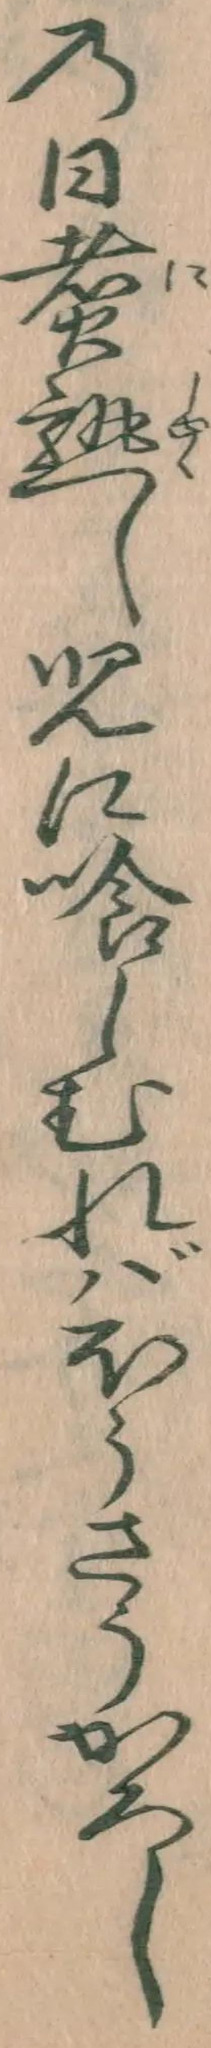の日煮熟し児に喰しむればほうさうかろし
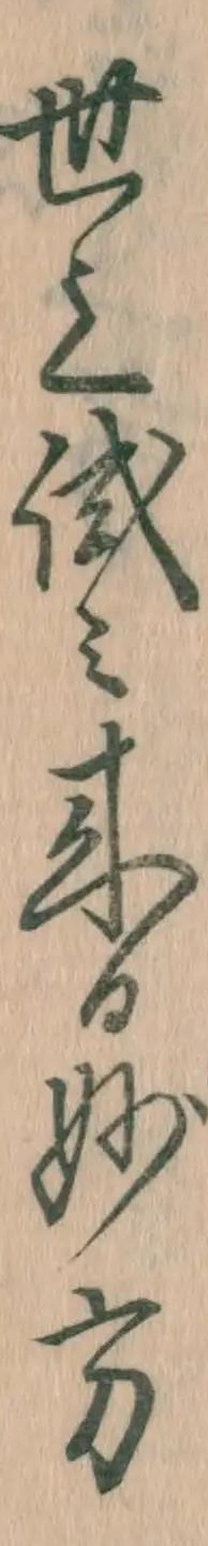世上試み来る妙方
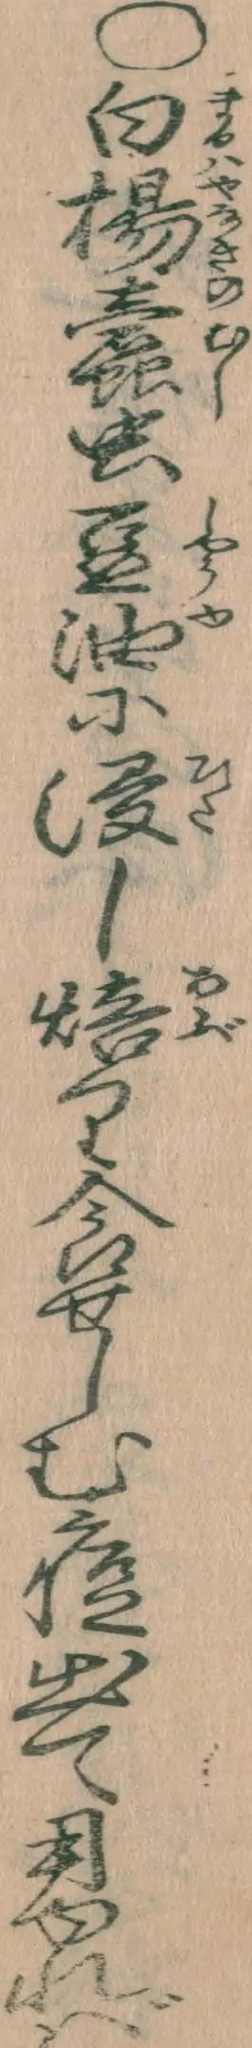○白楊蠧虫豆油に浸し焙り食せしむ痘出て用ゆれば
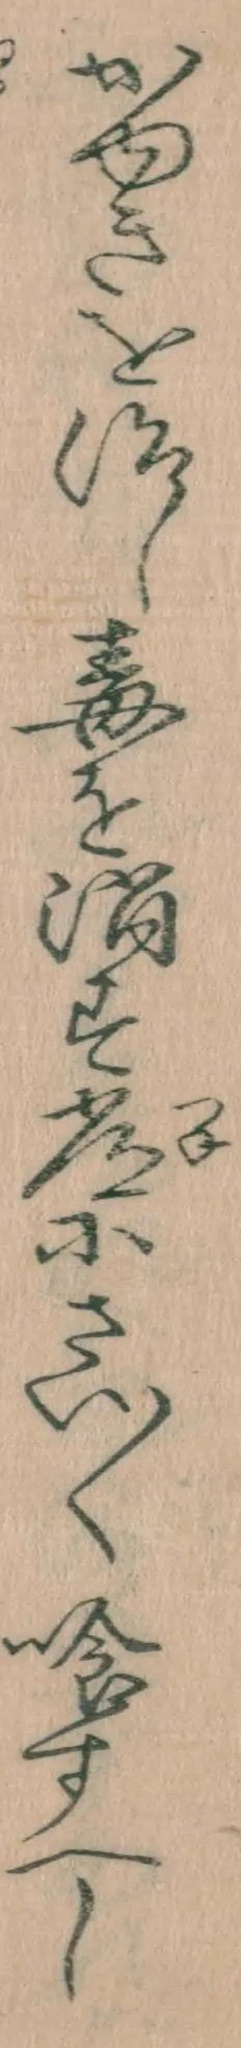かゆきを治し毒を消す常にさい〳〵喰すへし
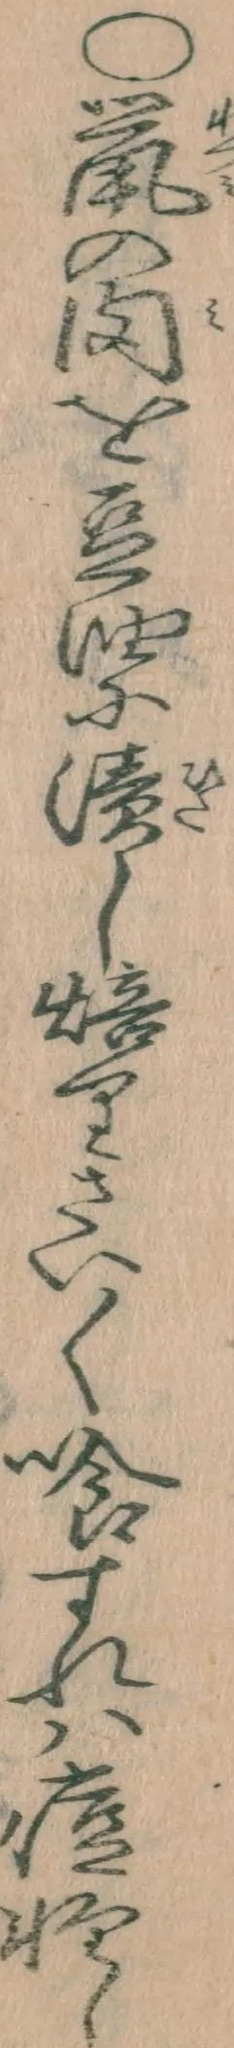○鼠の肉を豆油に漬し焙りさい〳〵喰すれは痘軽し
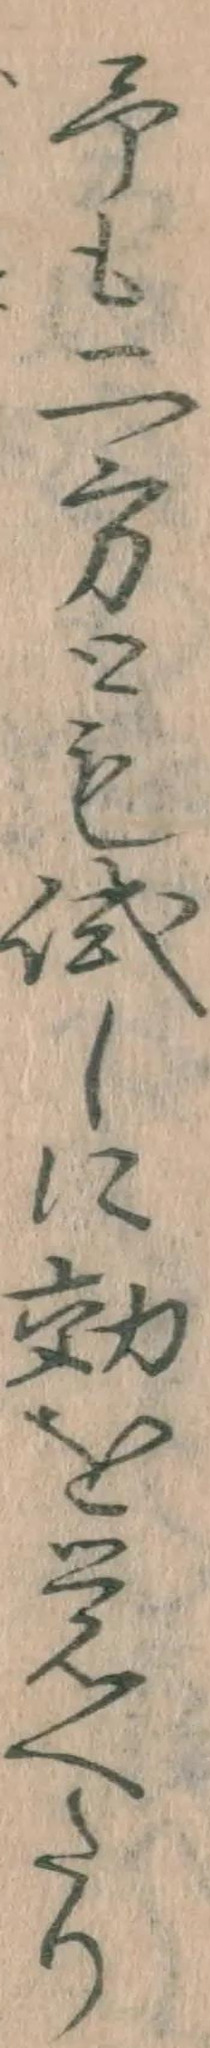予も二方とも試しに効を覚へたり
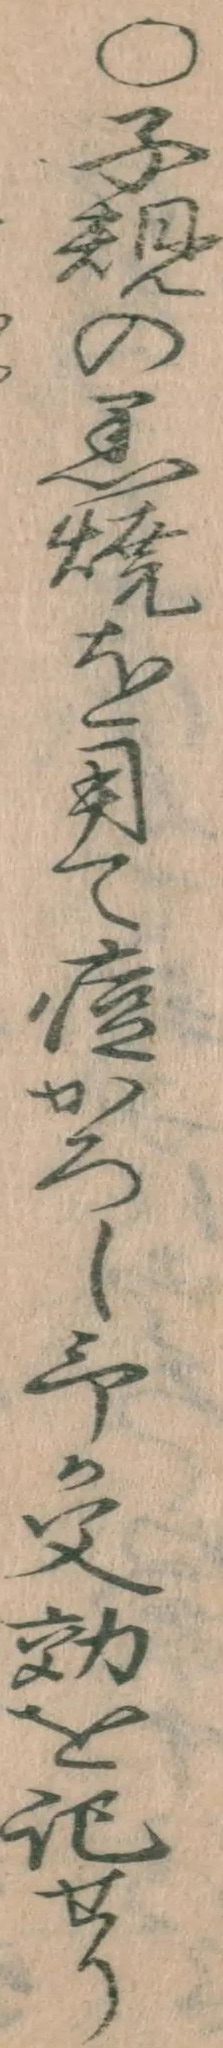○子規の黒焼を用て痘かろし予か父効を記せり
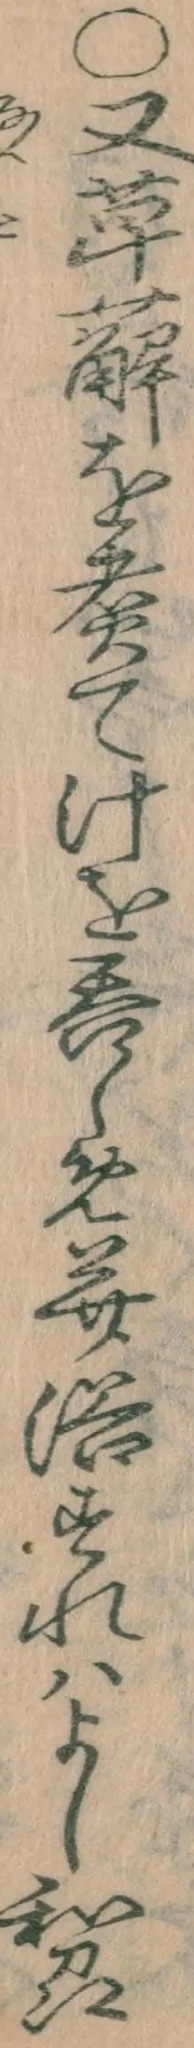○又草薢を煑て汁を呑しめ并浴すれはよし和州
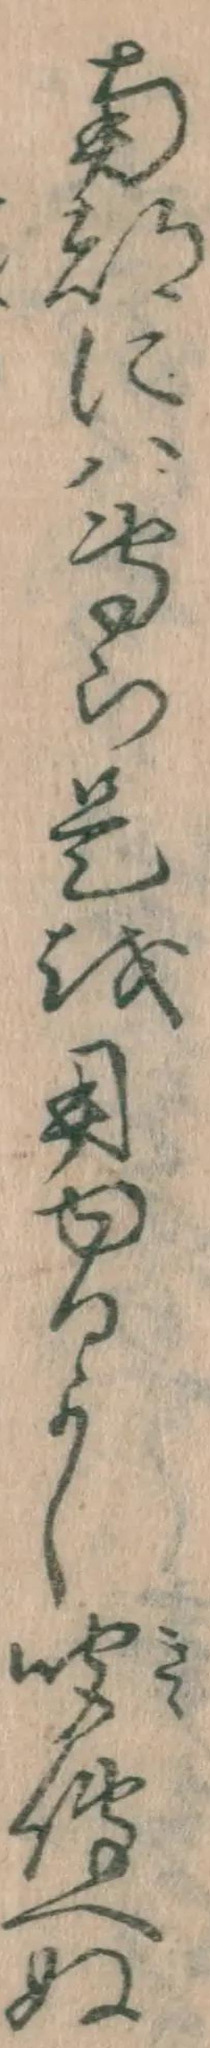南都には専ら是を用ゆるよし聞伝へぬ
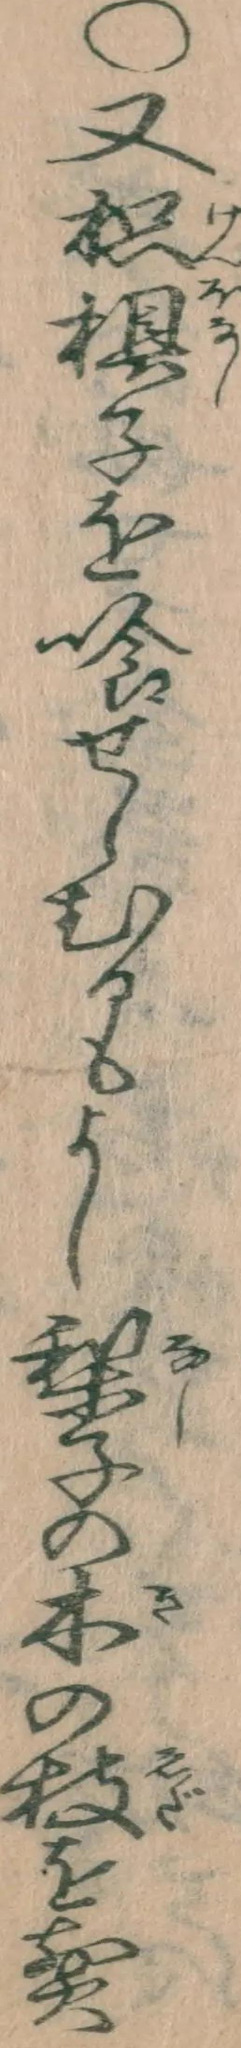○又枳梖子を喰せしむるもよし梨子の木の枝を煎
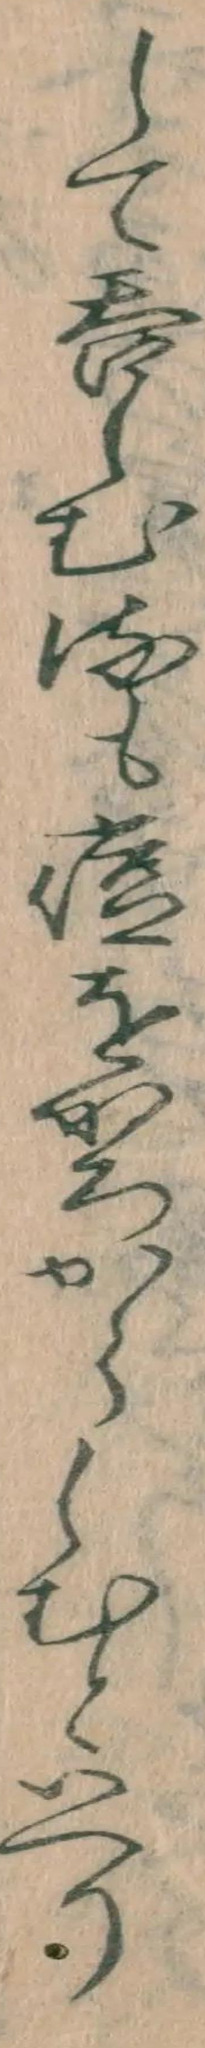して呑しむるも痘をかろからしむといへり
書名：痘家初心問答
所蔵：国立国会図書館 National Diet Library, JAPAN
